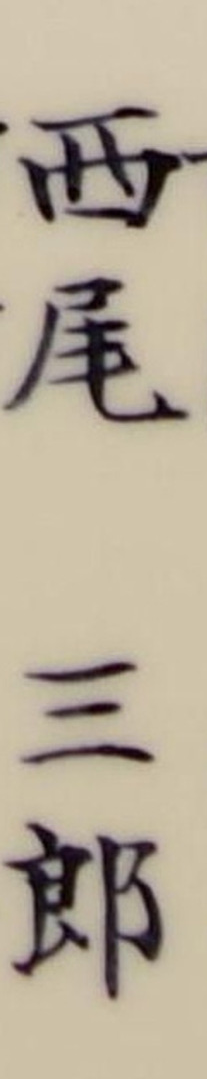西尾三郎
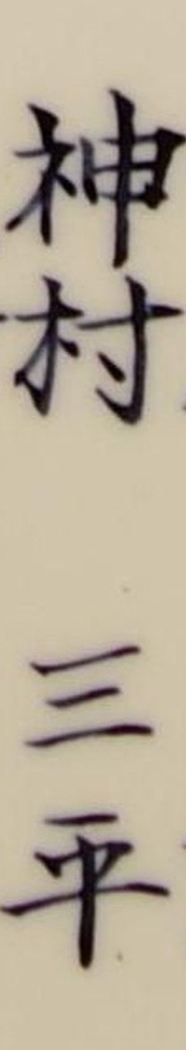神村三平
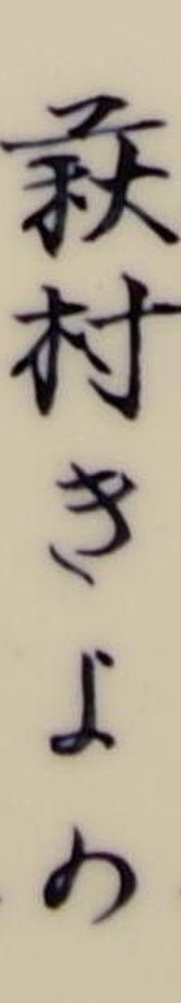萩村きよか
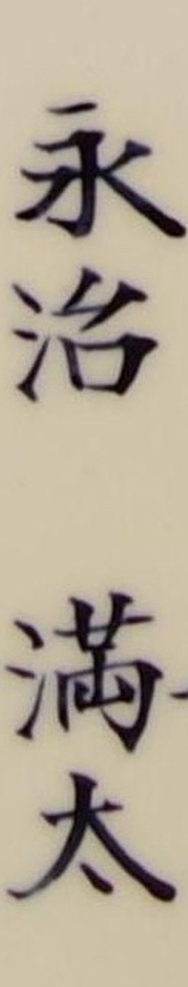永治満太
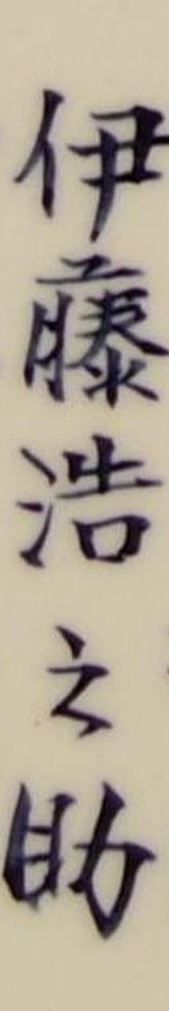伊藤浩之助
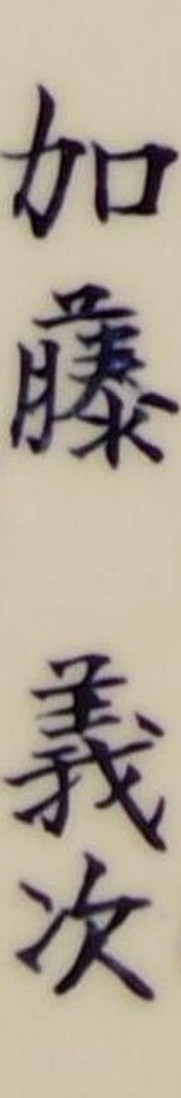加藤義次
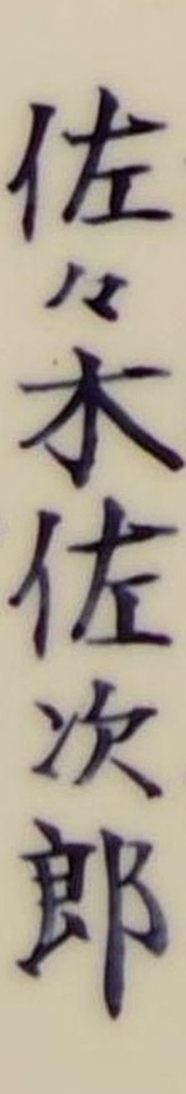佐々木佐次郎
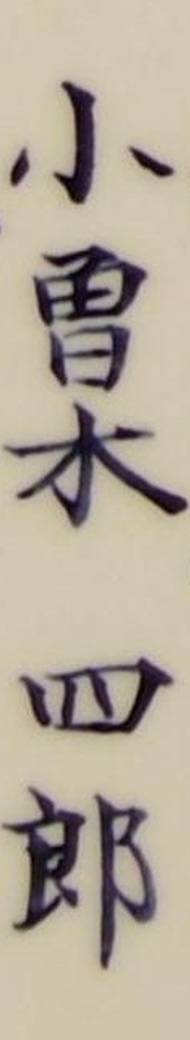小曽木四郎
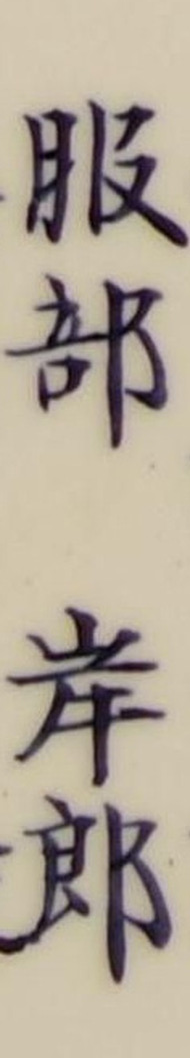服部岸郎
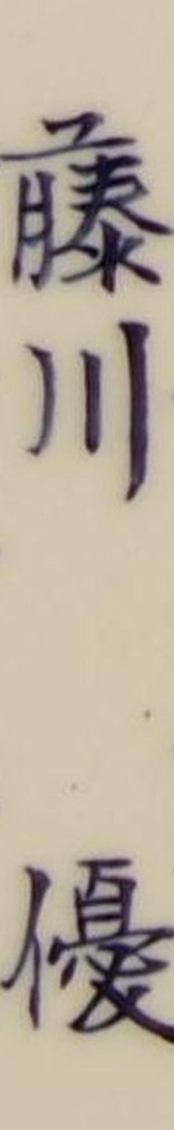藤川優
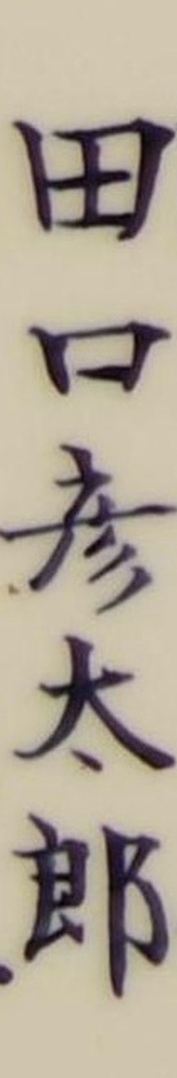田口彦太郎
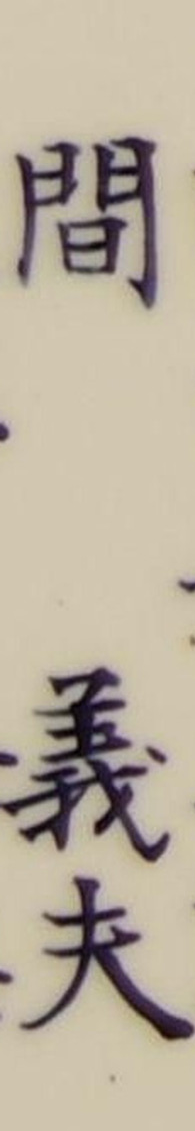間義夫

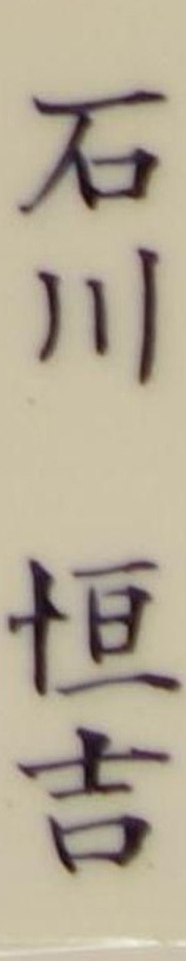石川恒吉
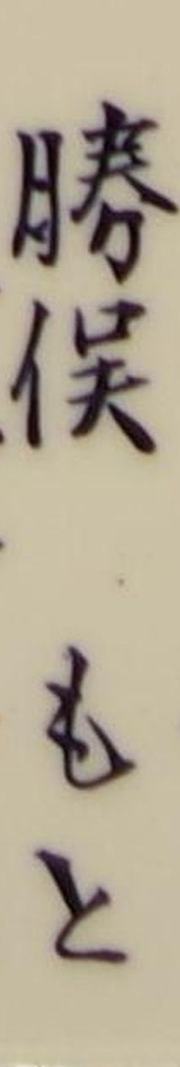勝俣もと
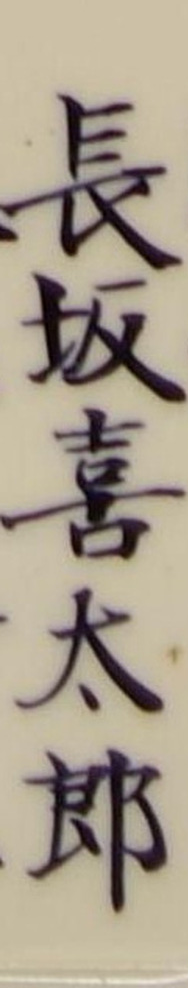長坂喜太郎
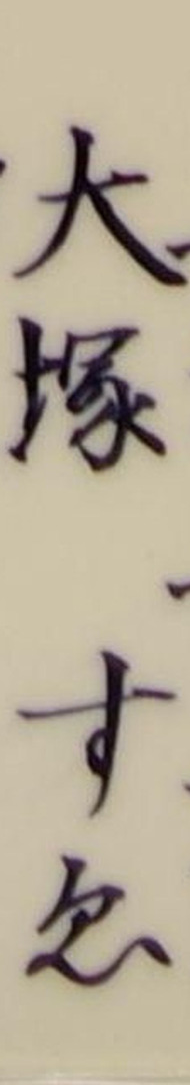大塚すゑ
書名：A~D
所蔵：koyasan kongobuji
